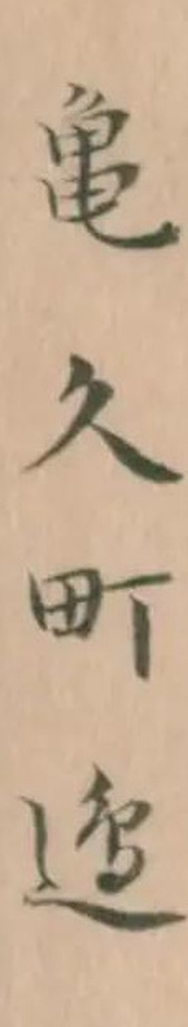亀久町辺

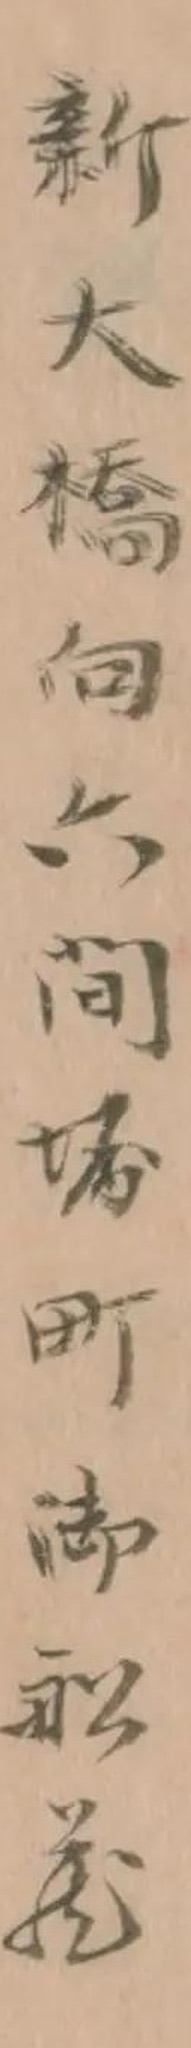新大橋向六間堀町御船蔵
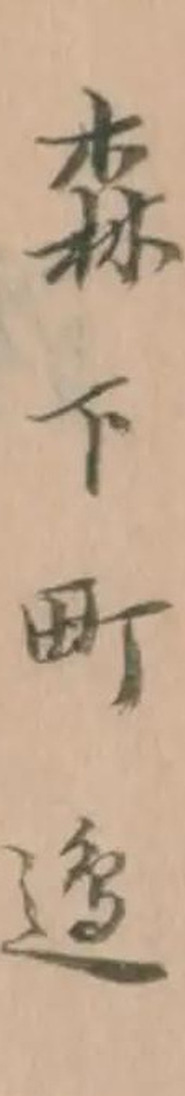森下町辺

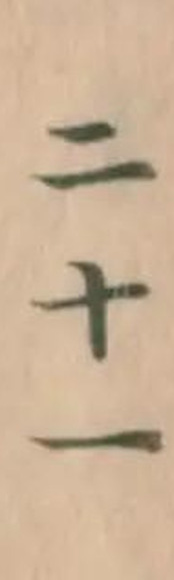二十一
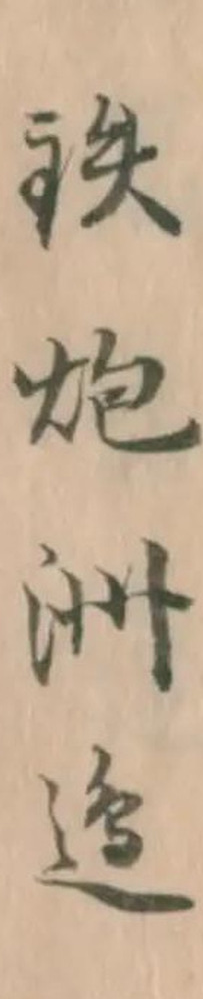鉄砲洲辺

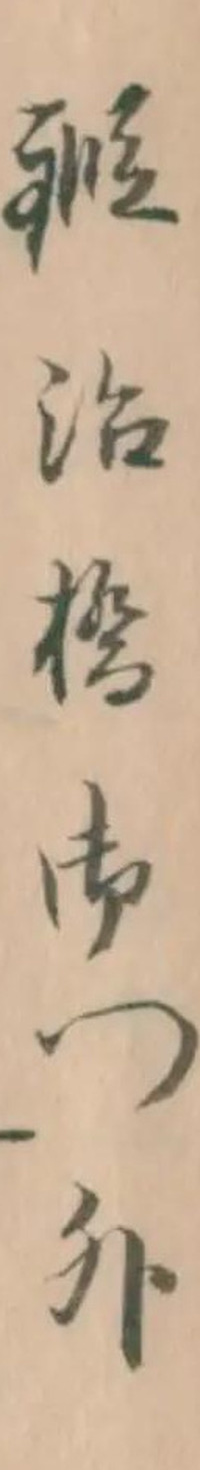鍛冶橋御門外
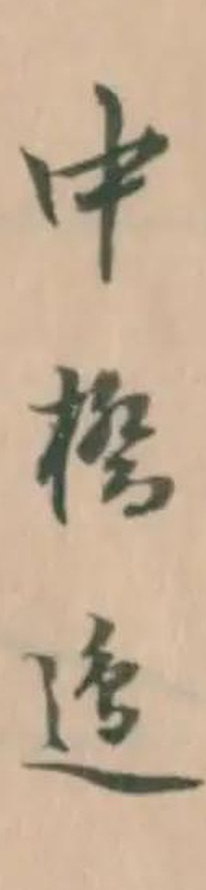中橋辺
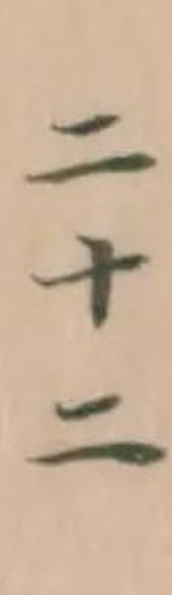二十二

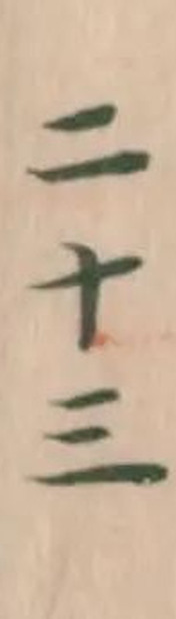二十三
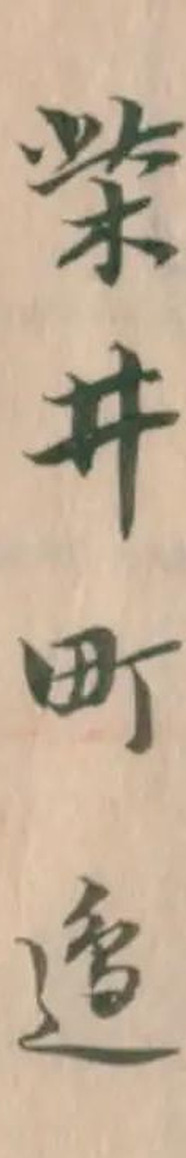柴井町辺

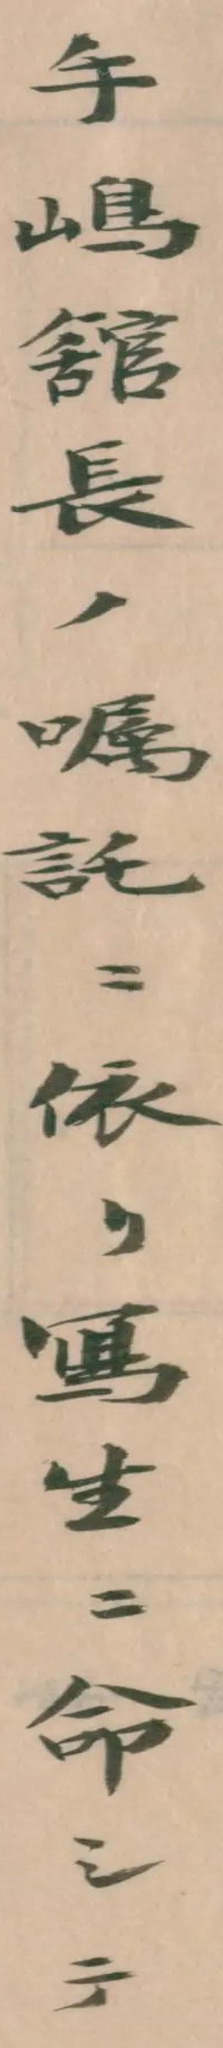手嶋館長ノ嘱託ニ依リ写生ニ命シテ
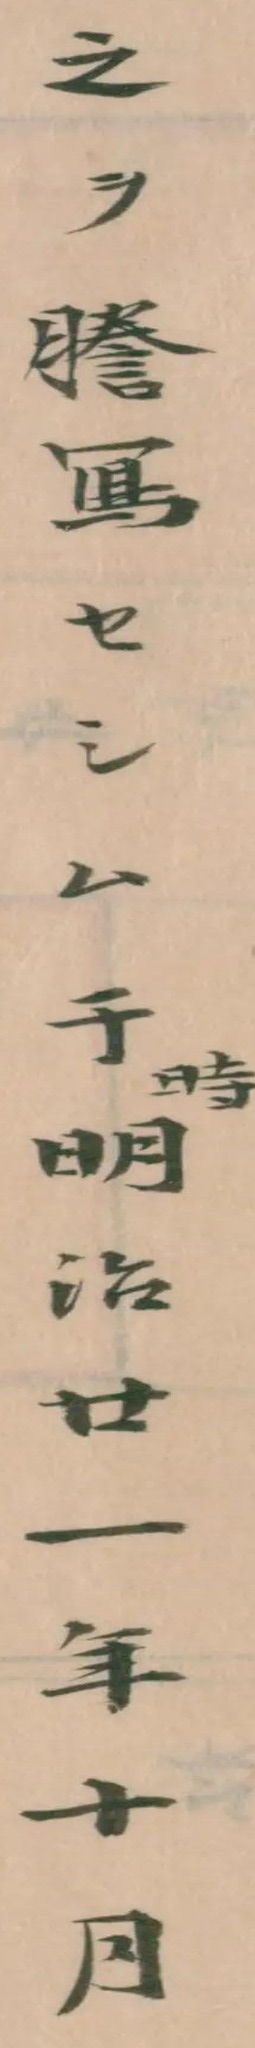之ヲ謄写セシム于時明治廿一年十月
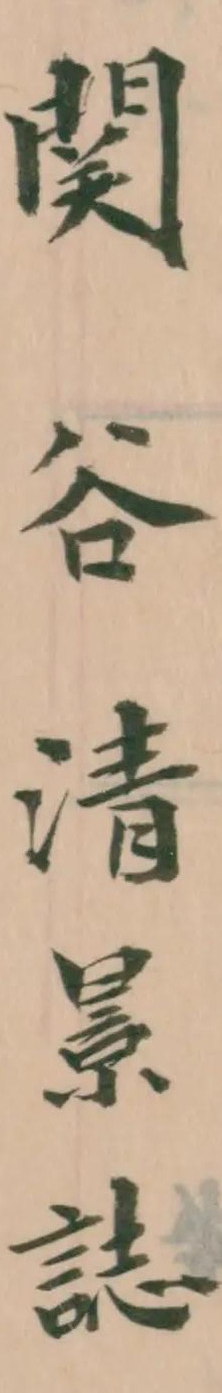関谷清景誌

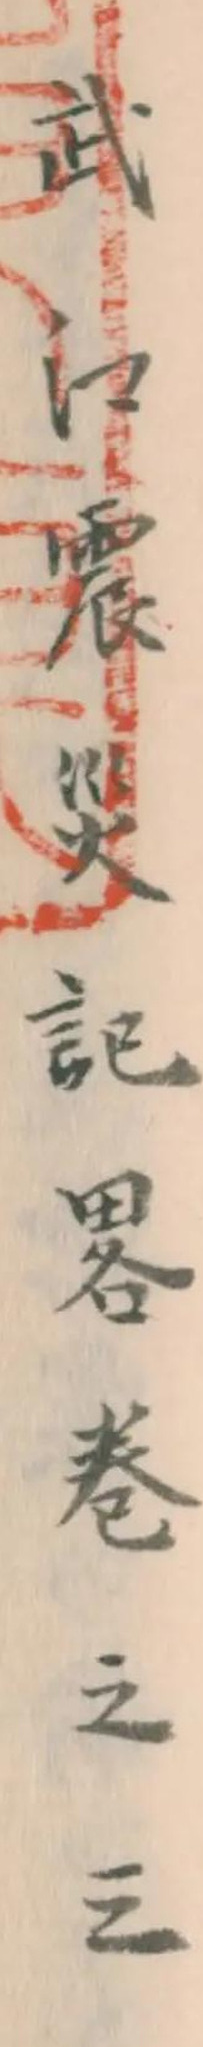武江震災記略巻之三
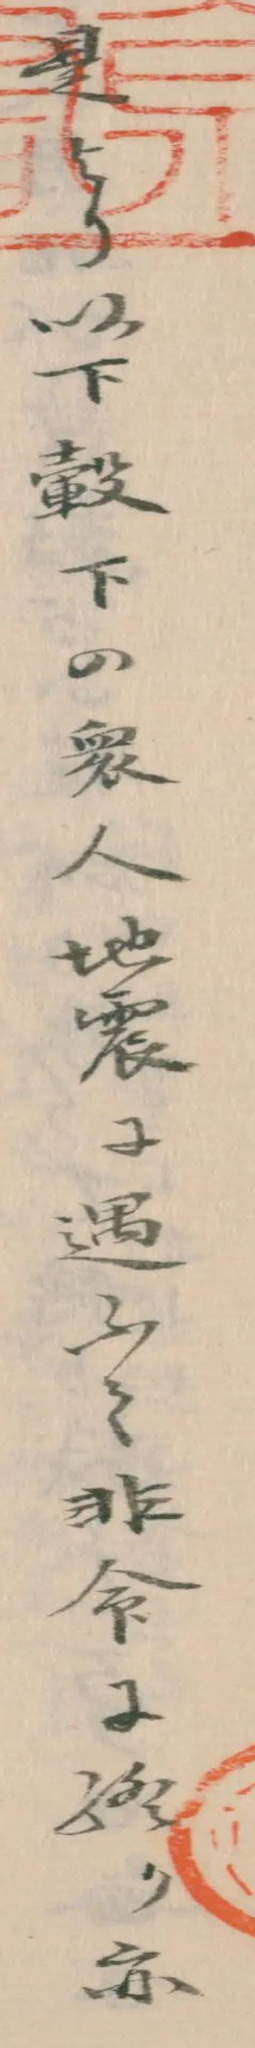是より以下轂下の衆人地震に遇ふて非命に終り亦
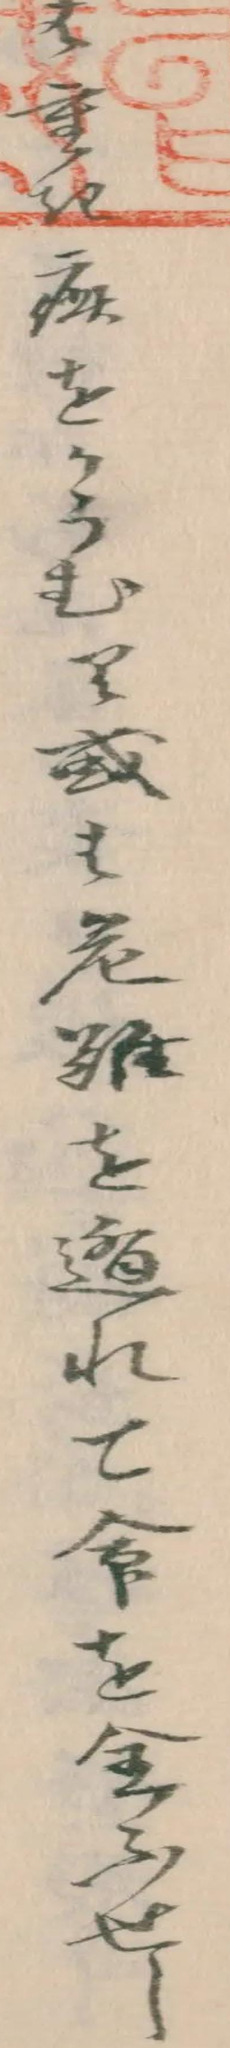は重き疵をかうむり或は危難を遁れて命を全ふせし
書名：地災撮要. 巻7-9(地震之部)
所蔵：国立国会図書館 National Diet Library, JAPAN
